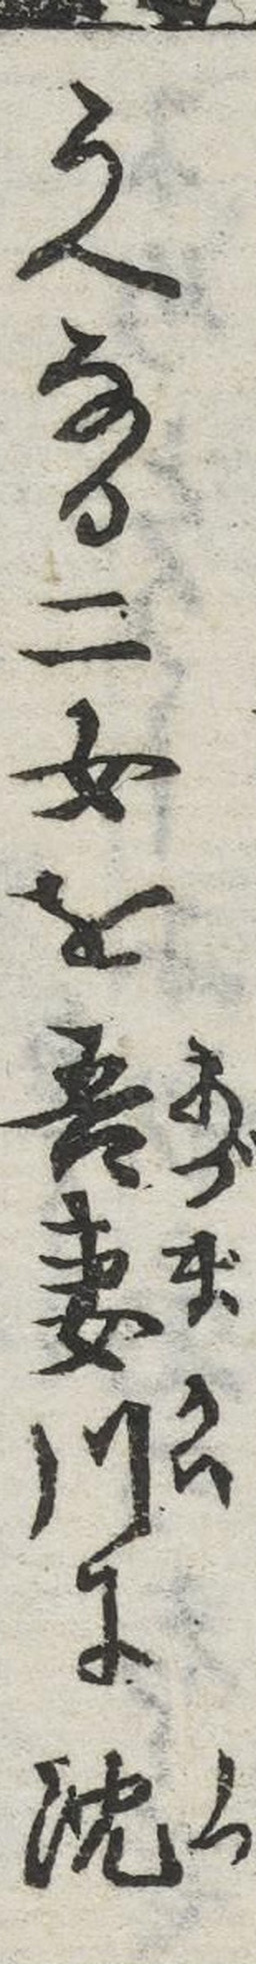うへなる二女を吾妻川に沈
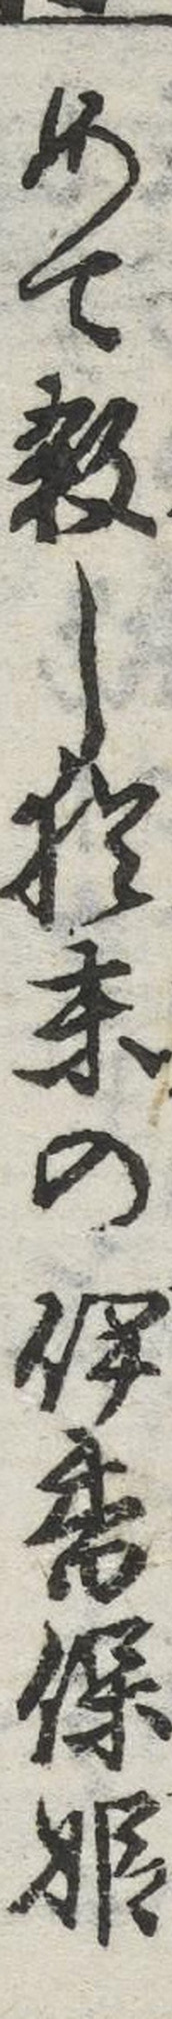めて殺し猶末の伊香保姫
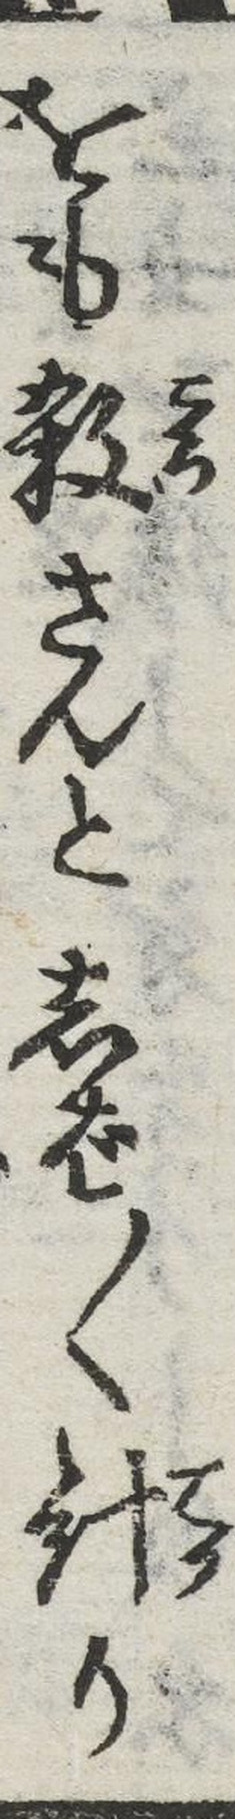をも殺さんとしば〳〵計り
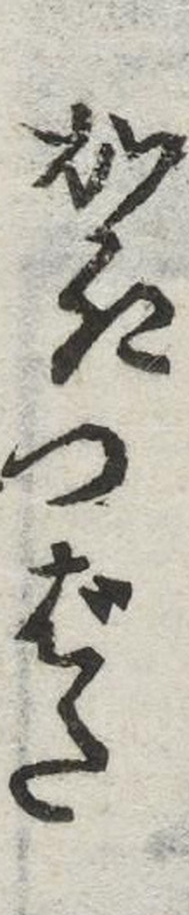かきつばた
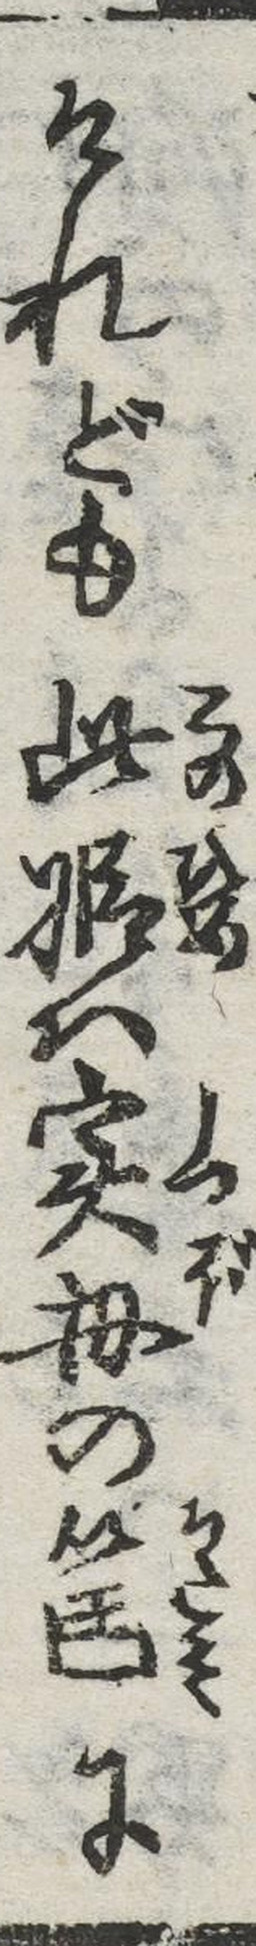たれども此姫ハ實母の筐に
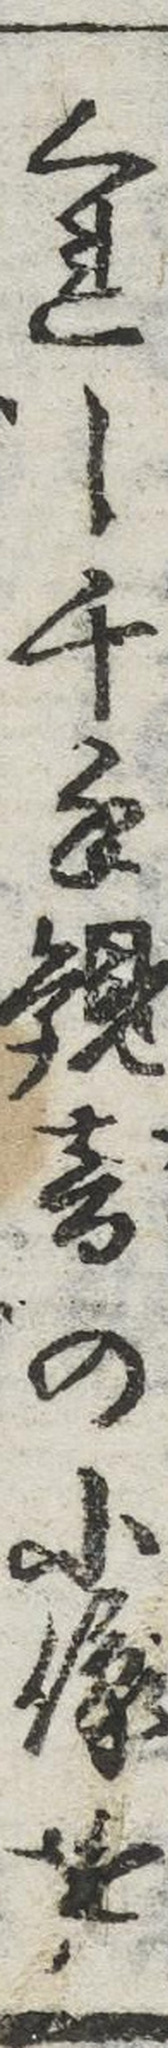くれし千手観音の小像を
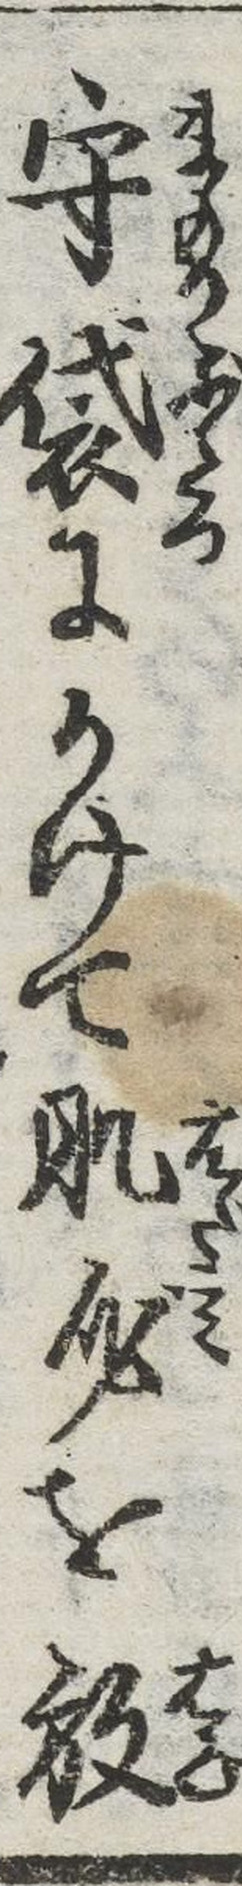守袋にかけて肌身を放
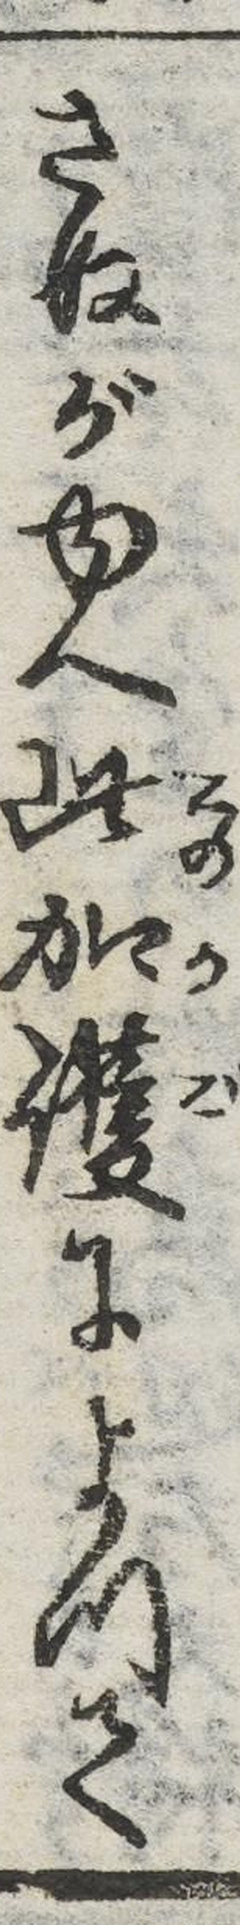さぬがゆへ此加護によつて
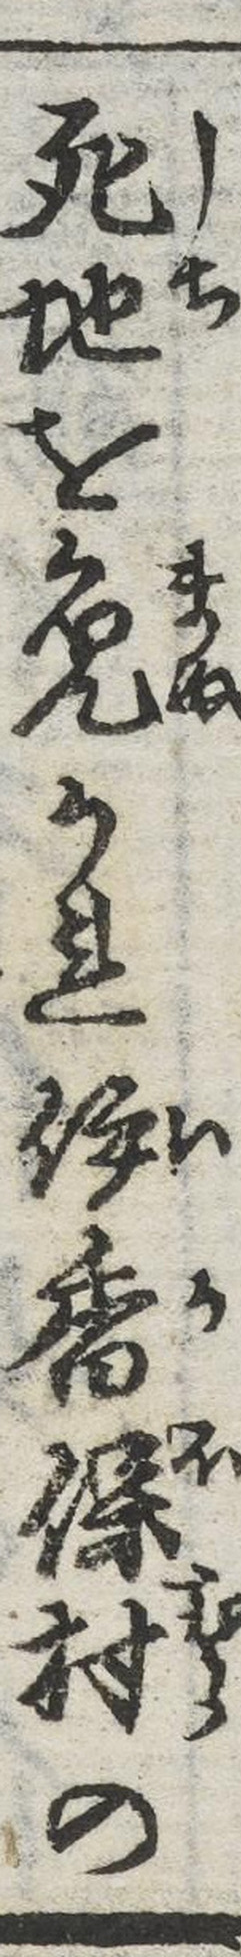死地を免かれ伊香保村の
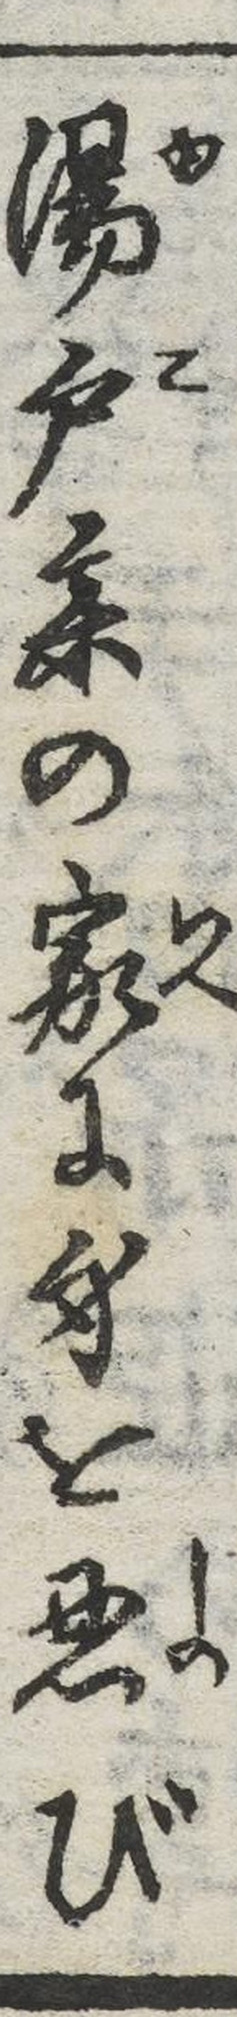湯戸集の家に身を忍び
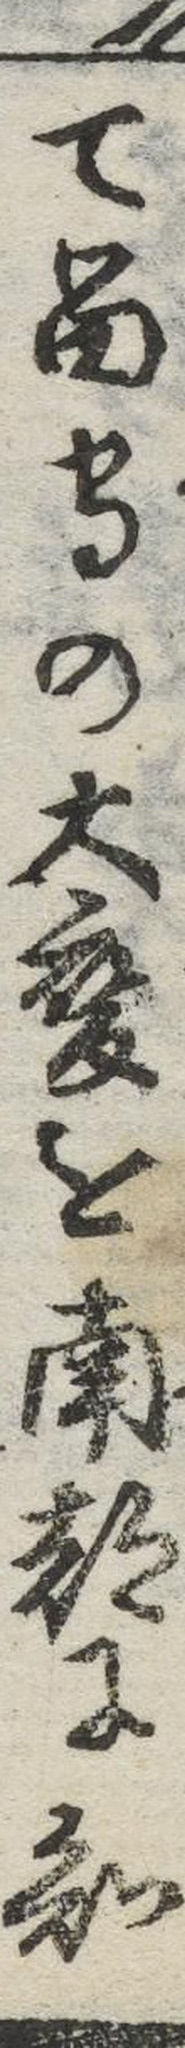て留守の大変を南都に知
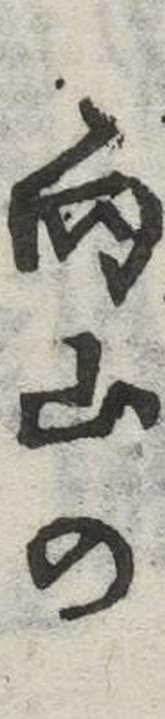向山の
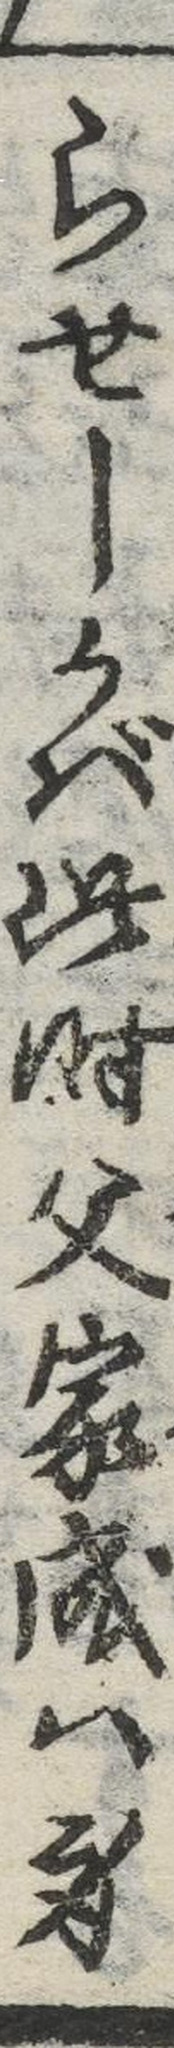らせしかバ此時父家茂は身
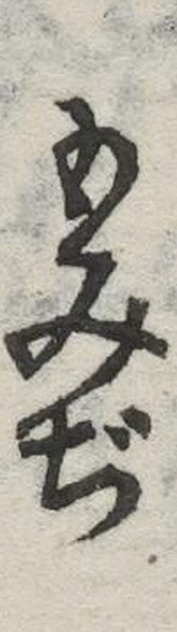もみぢ
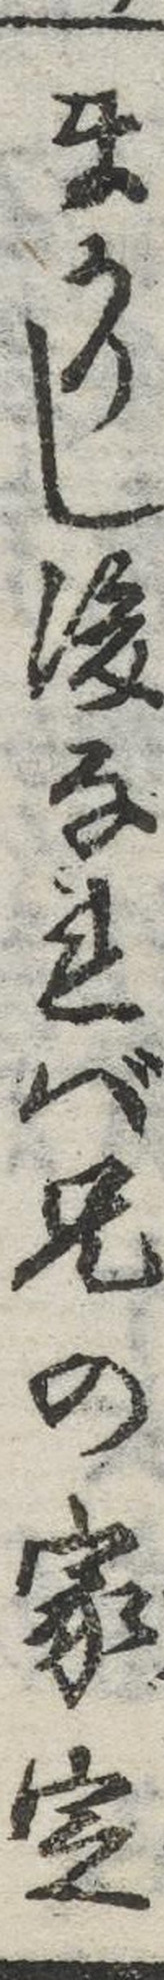まかりし後なれば兄の家定
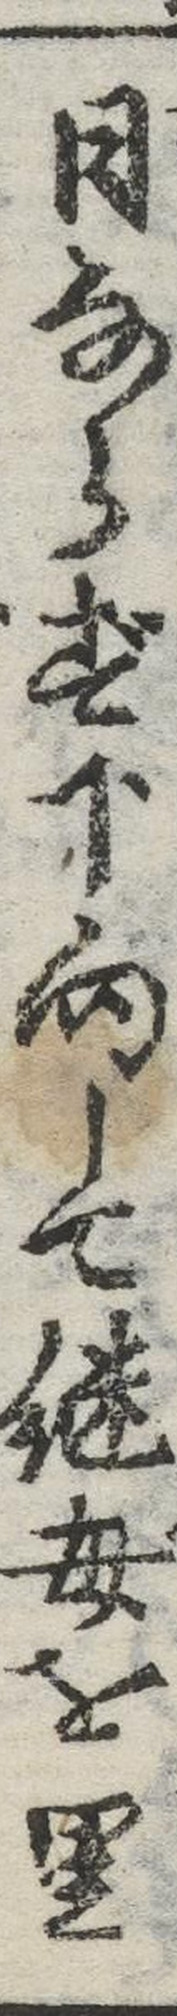日ならず下向して継母を里
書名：諸國温泉遊覽記　全
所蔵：東京大学地震研究所図書室 Earthquake Research Institute Library, The University of Tokyo, JAPAN
